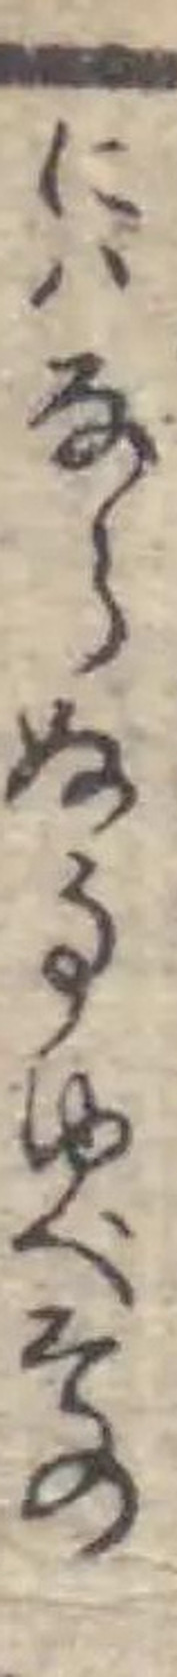にはならぬ事ゆへその
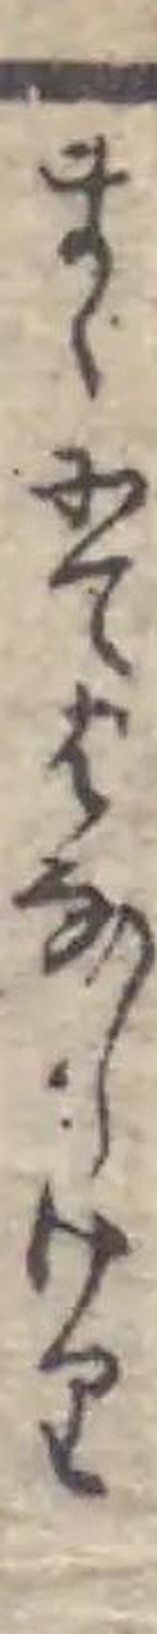まゝにてはなしけり
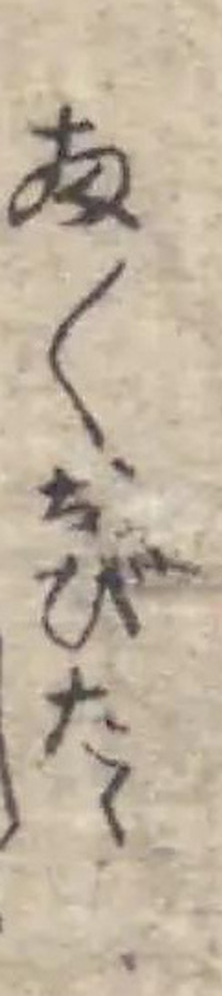扨〳〵おびたゝ
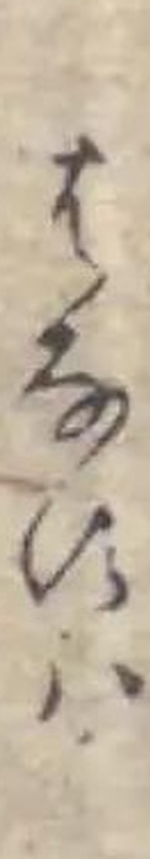はなすは
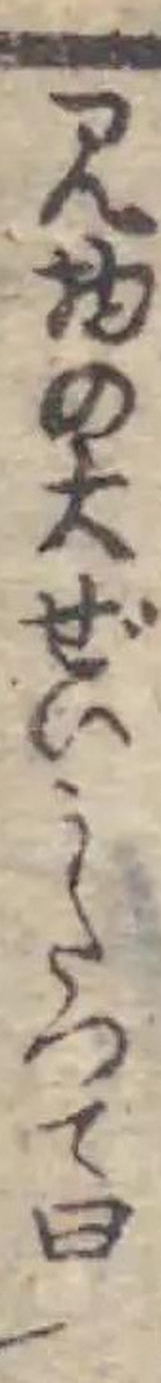見物の大ぜいうたつて曰
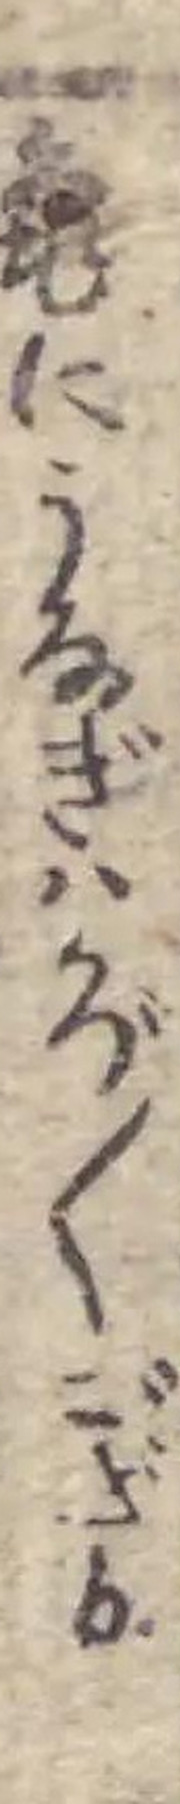亀にうなぎはかづ〳〵ござる
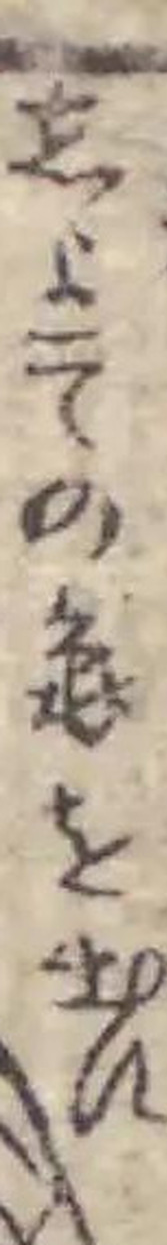しよこくの亀を出す
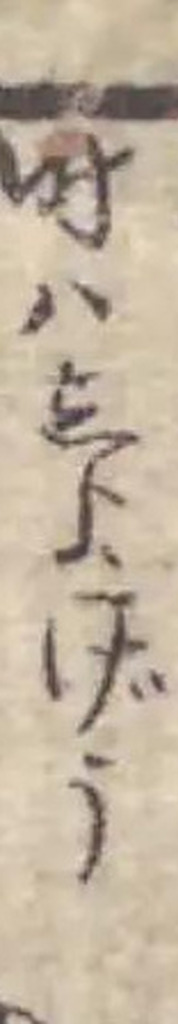時はしよげう
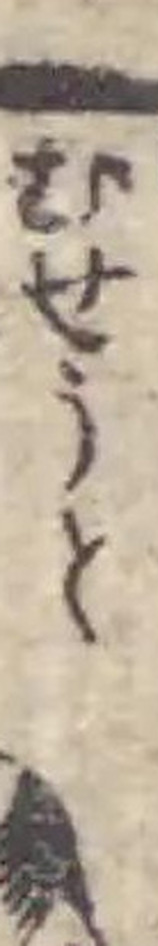むせうと
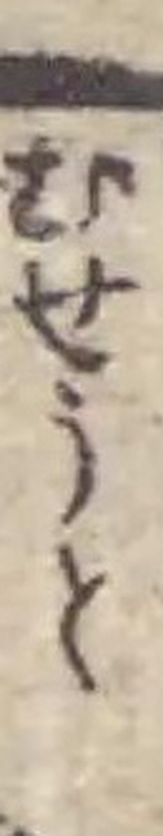むせうと
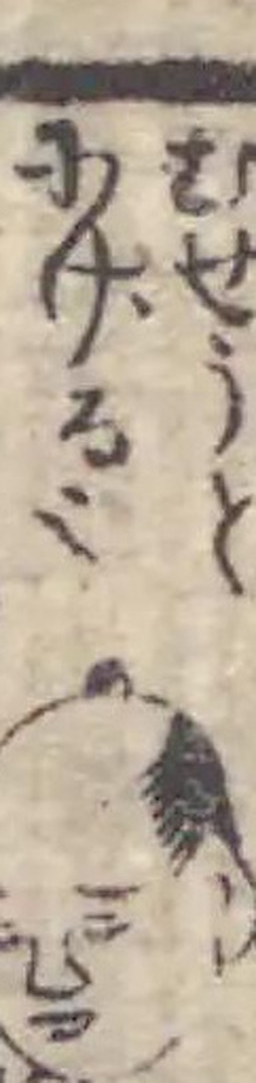にげる也
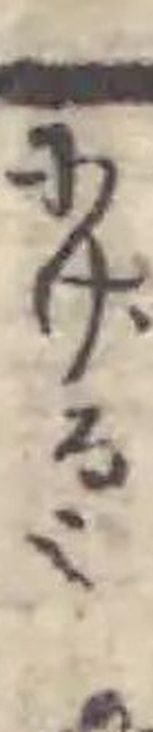にげる也
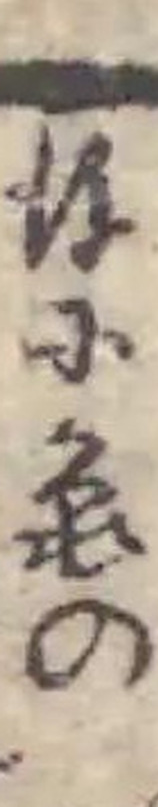後に亀の
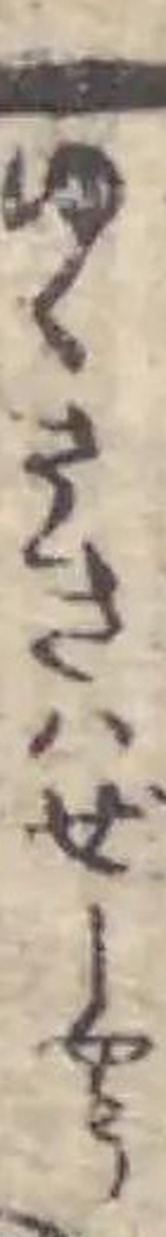ゆくさきはぜしやう
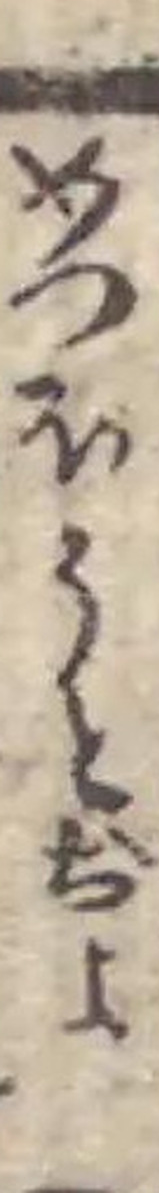めつほうとおよ
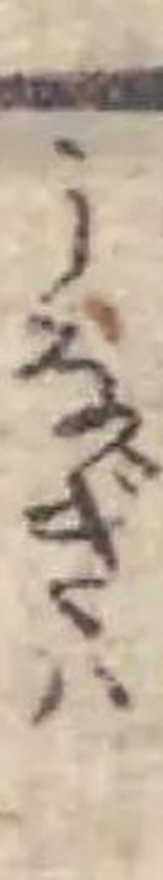うなぎは
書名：見立蓬莱 : 2巻
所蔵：国立国会図書館 National Diet Library, JAPAN
